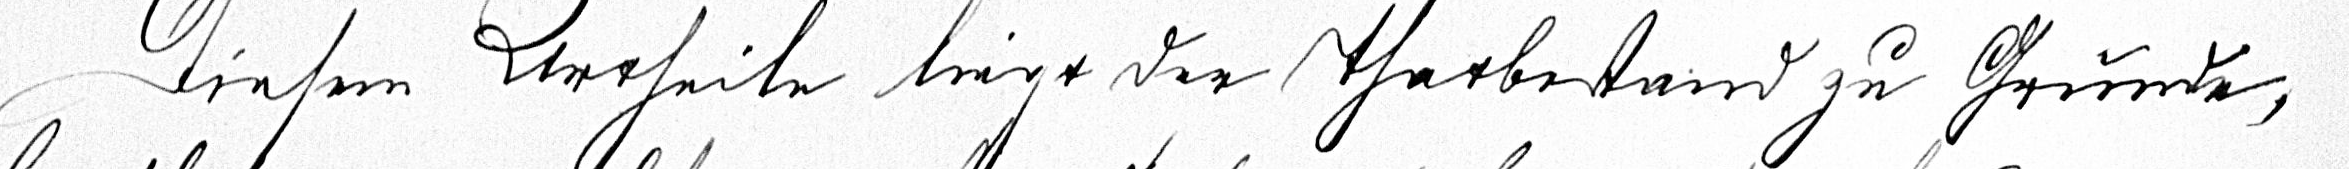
Diesem Urtheile der Thatbestand zu Grunde,
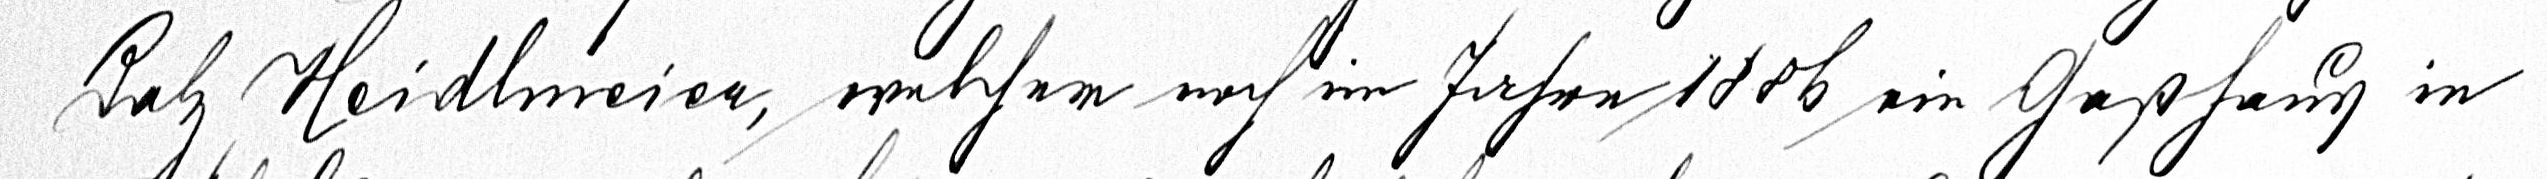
daß Heidlmeier, welcher noch im Jahre 1886 ein Gaßhaus in
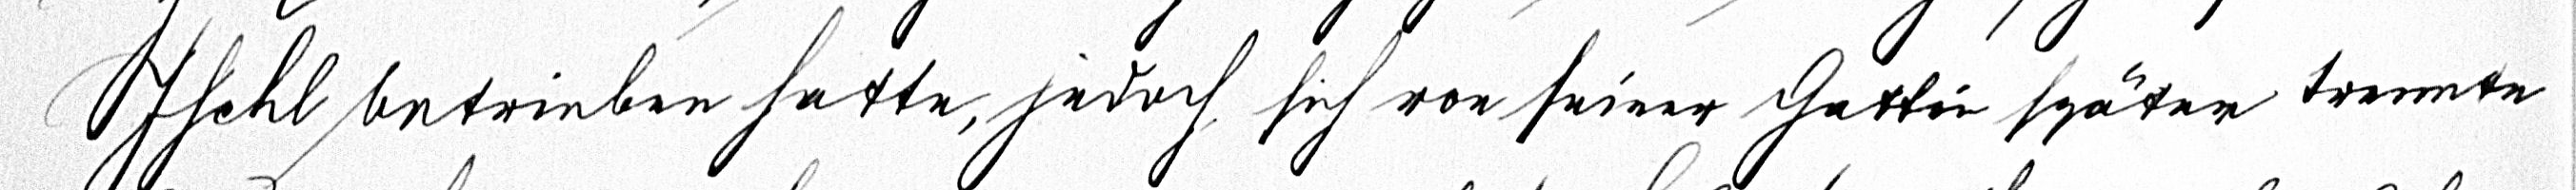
Pfehl betrieben hatte, jedoch sich von seiner Gattin später trennte
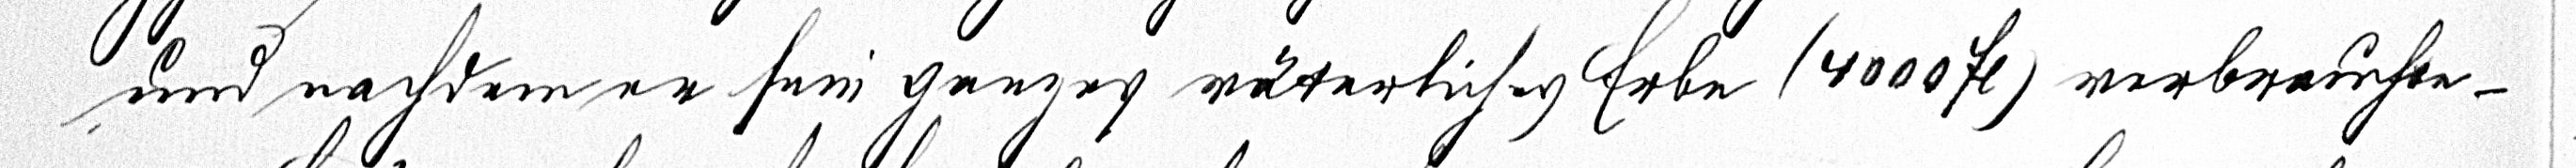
und nachdem er sein ganzes väterliches Erbe (4000 fl) verbrauchte -
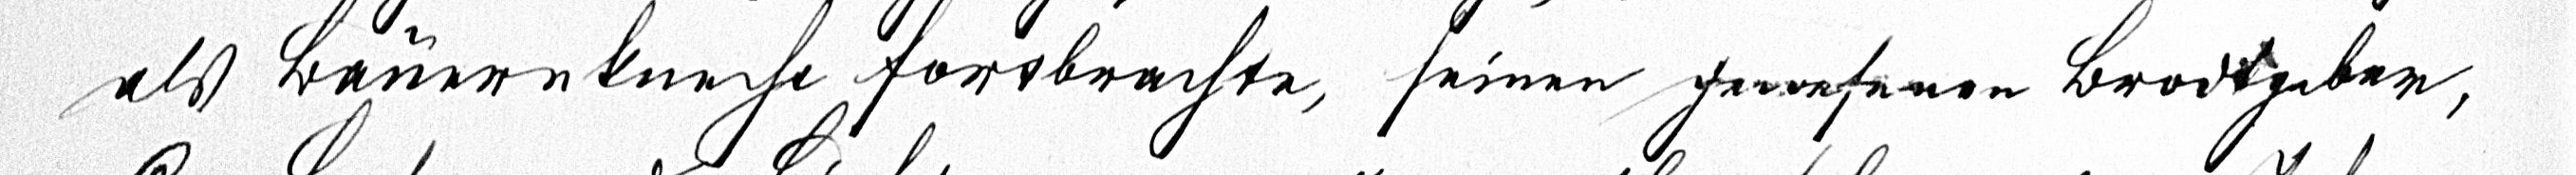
als Bauernknecht fortbrachte, seinen gewesenen Brotgeber,
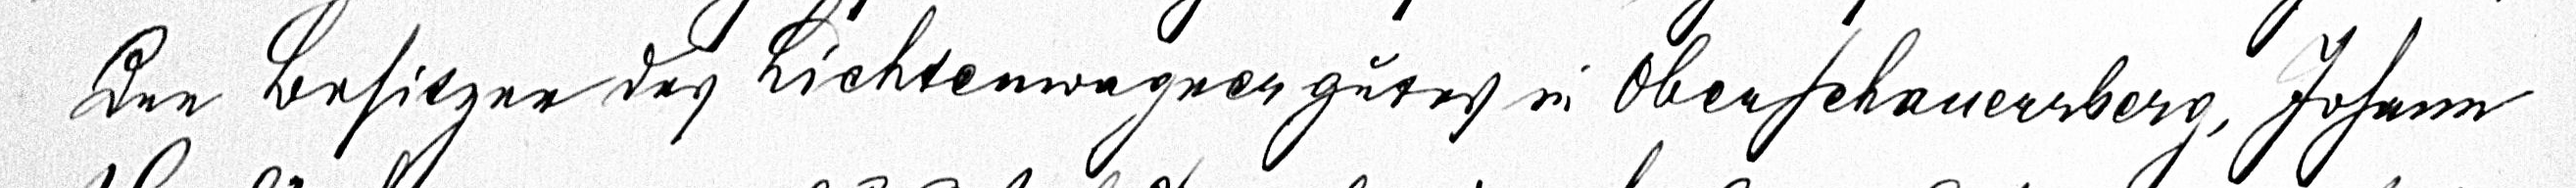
den Besitzer des Lichtenwagnen gutes in Oberschauersberg, Johann
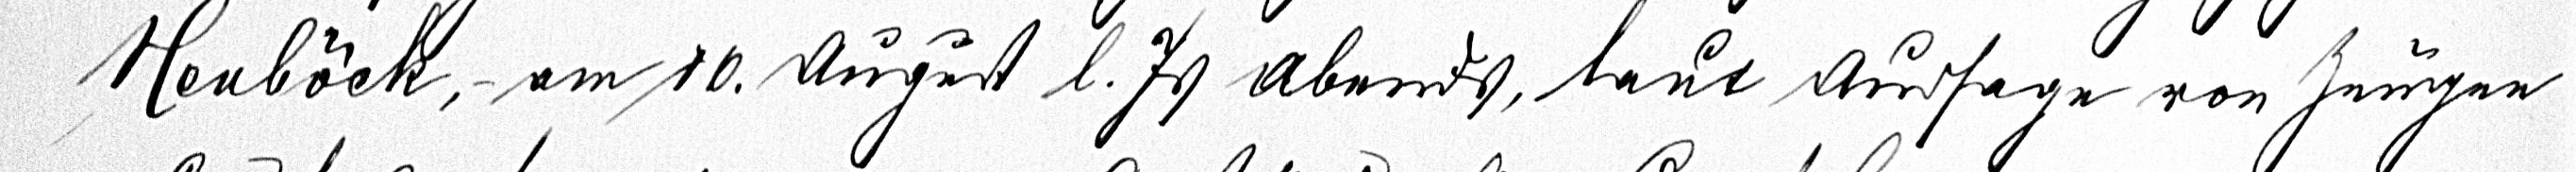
Heuböck, - am 10. August l. Is Abends, laut Aussage von Zeugen
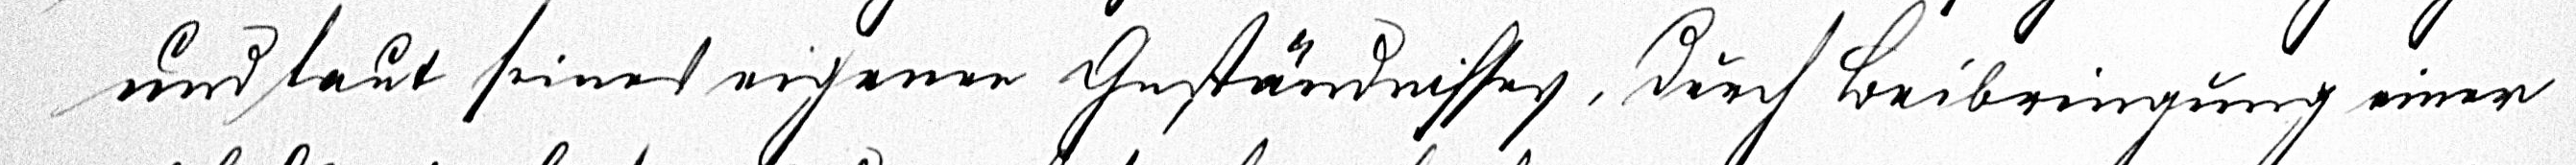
und laut seines eigenen Geständnisses, durch Beibringung einer
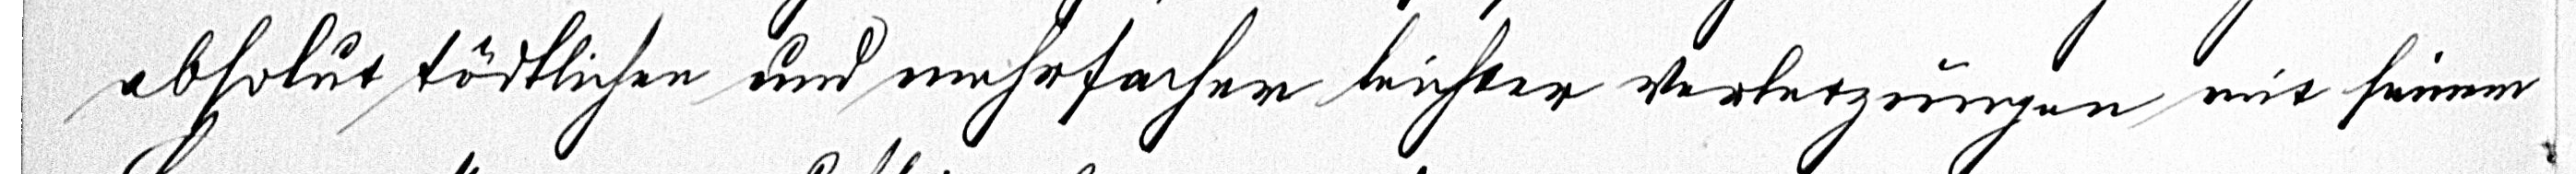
absolut tödtlichen und mehrfacher leichter Verletzungen mit seinen
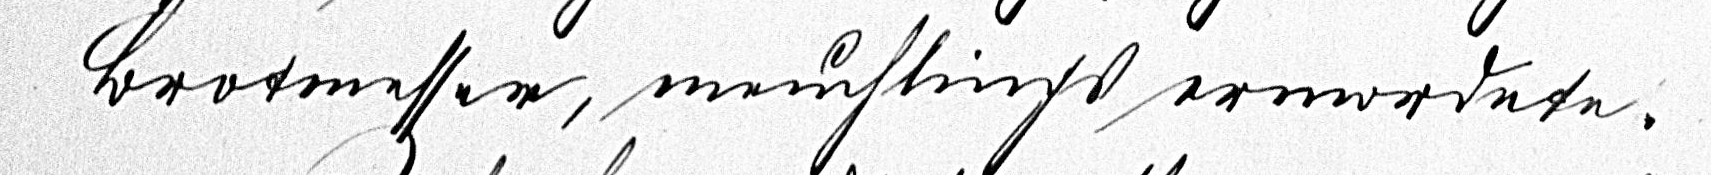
Brotmesser, meuchlings ermordete.
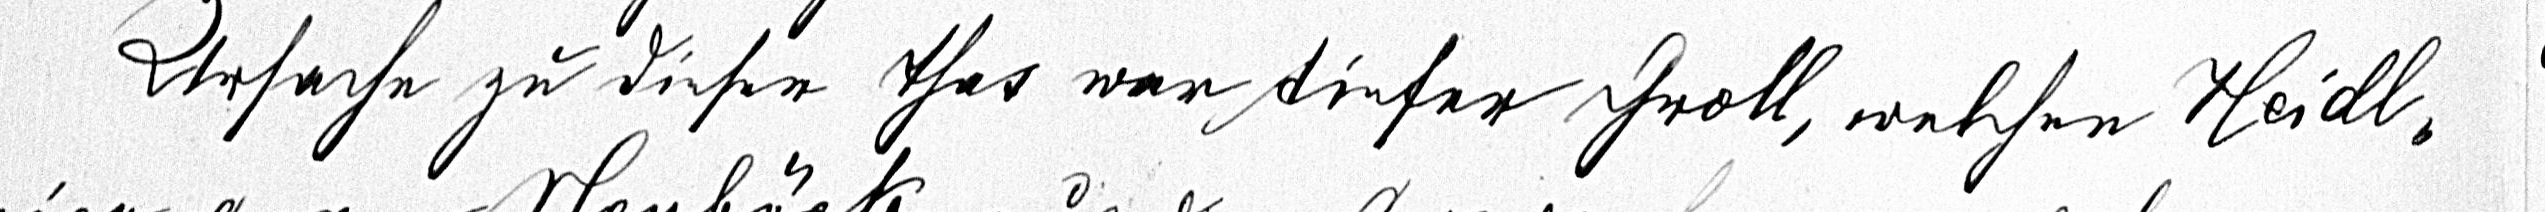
Ursache zu diesen That war tiefer Groll, welchen Heidl¬
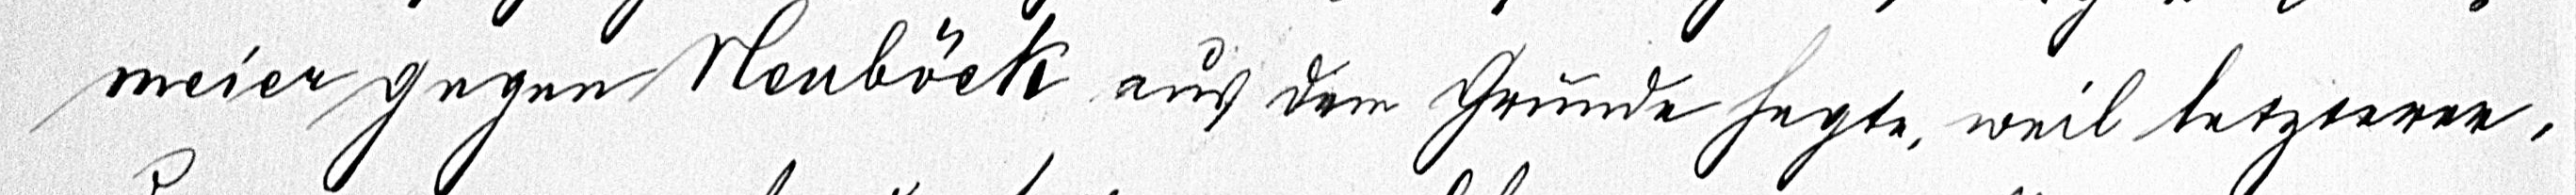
meier gegen Neuböck aus dem Grunde hegte, weil letzterer,
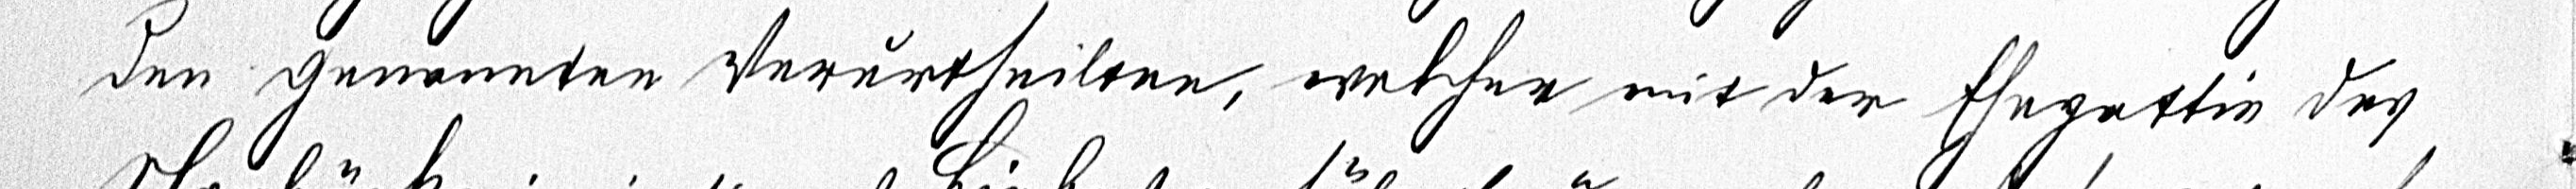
den genannten Verurtheilten, welcher mit der Ehegattin des
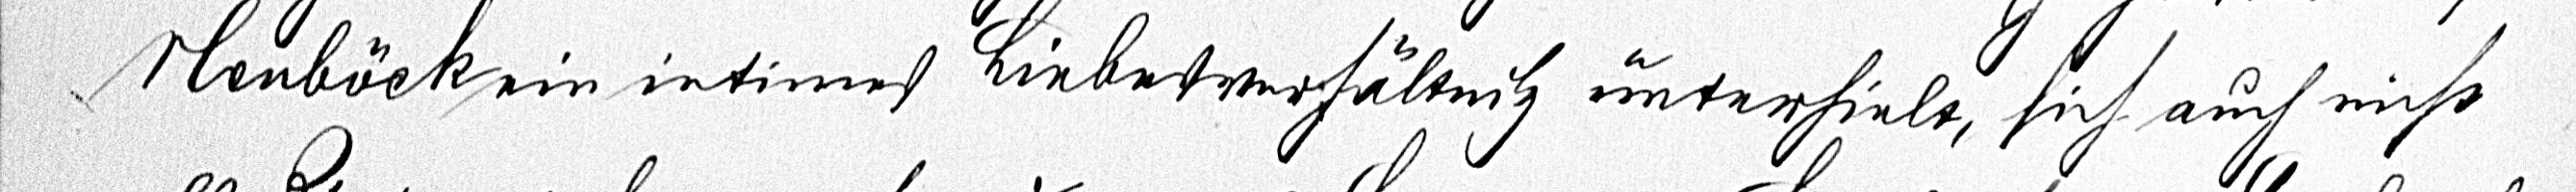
Neuböck ein intimes Liebesverhältniß unterhielt, sich auch nicht
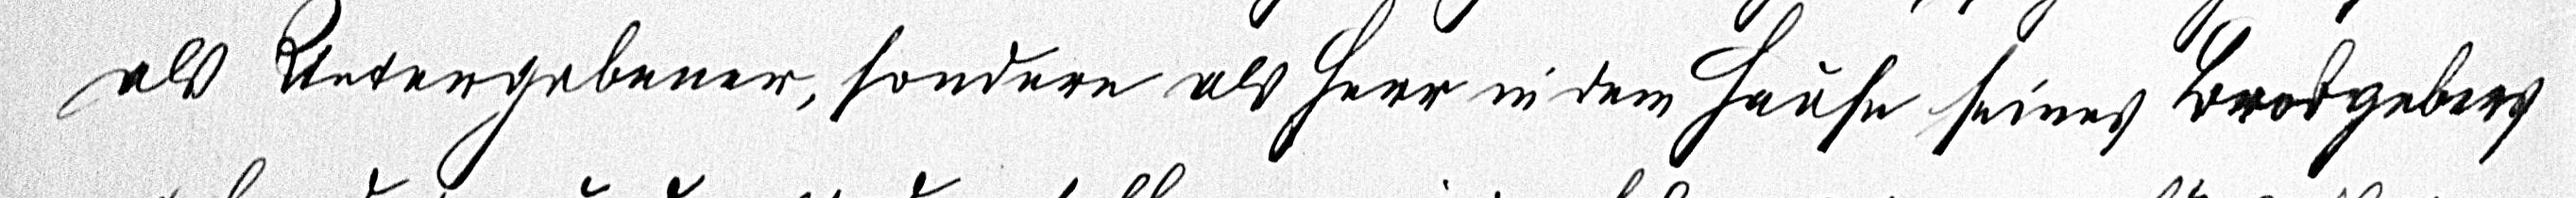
als Untergebener, sondere als Heer in dem Hause seines Brosgeberg
